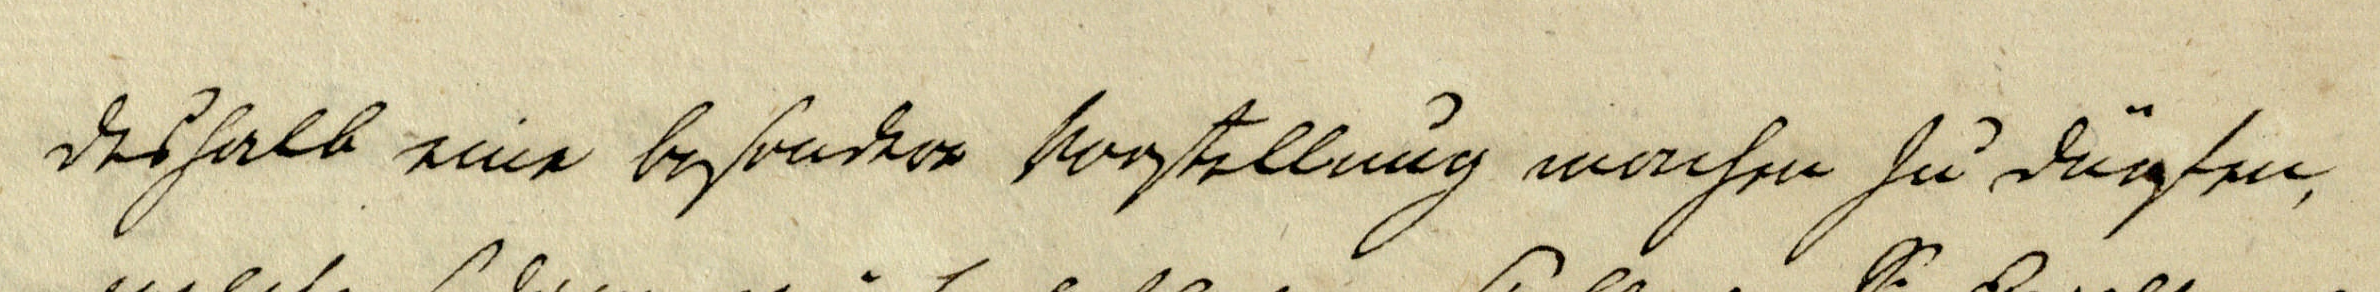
deshalb eine besondere Vorstellung machen zu dürfen,
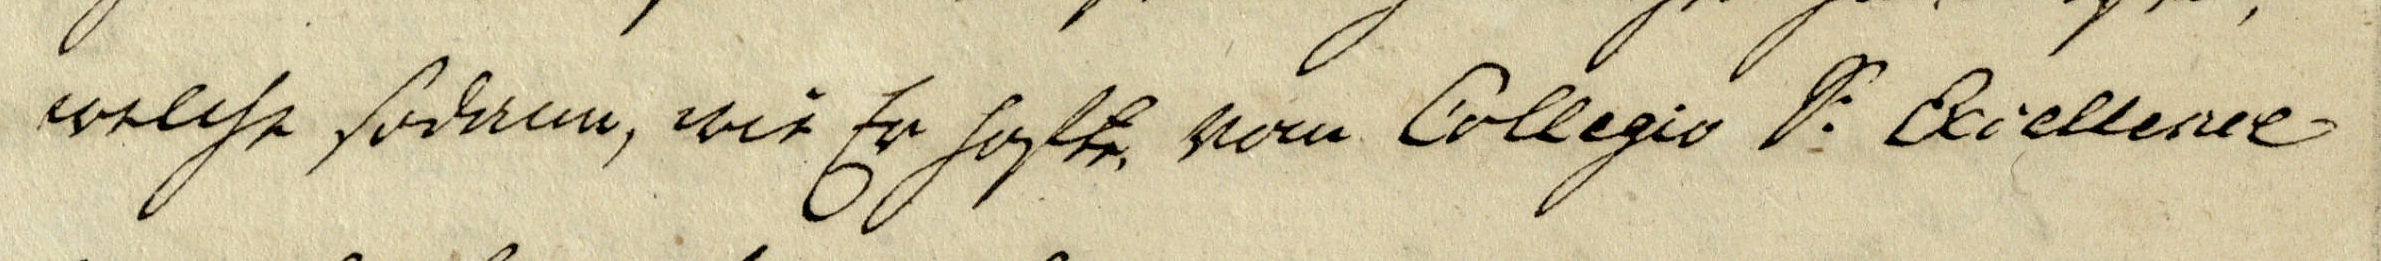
welche sodann, wie Er hofte vom Collegio Sr. Excellence
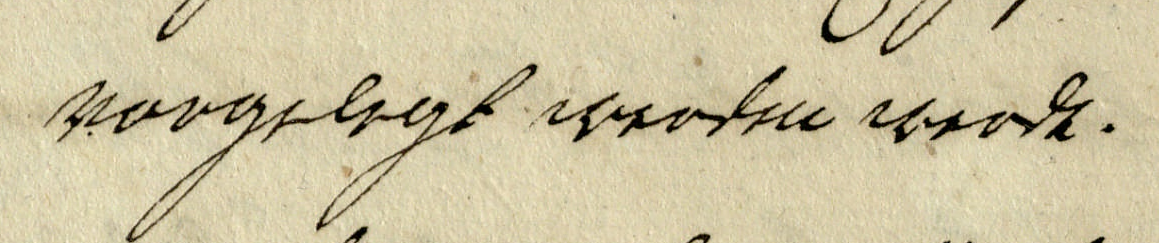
vorgelegt werden werde.
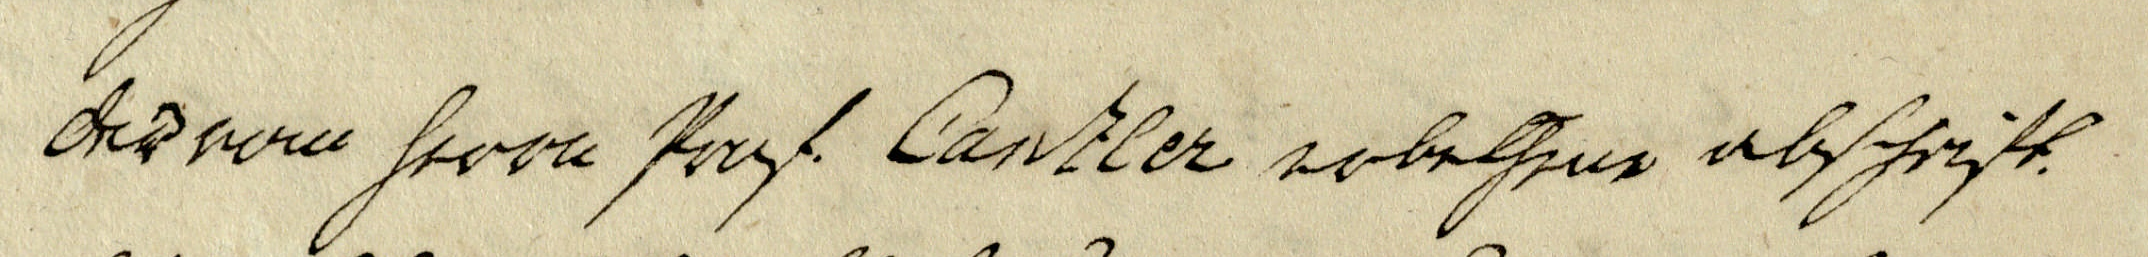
Der vom Herrn Prof. Canzler erbethene abschrift¬
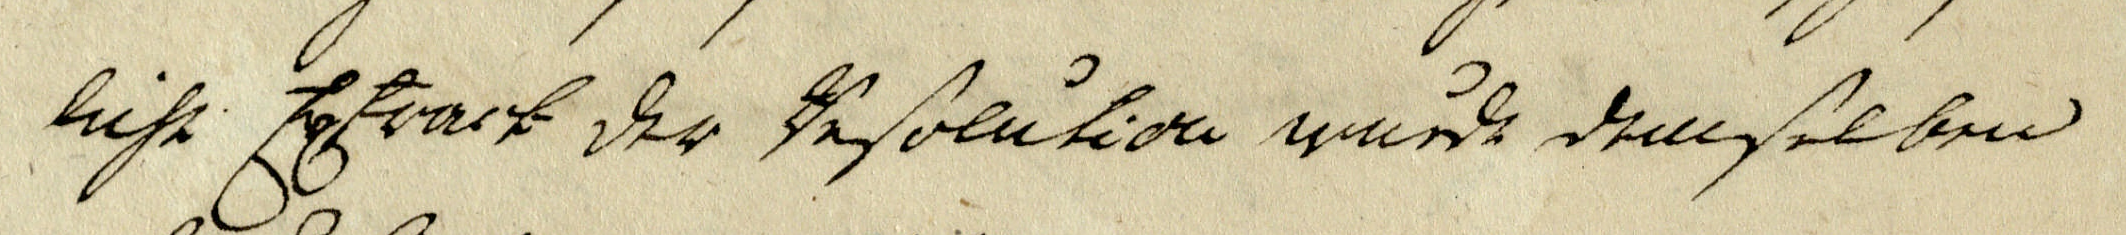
liche Extract der Resolution wurde demselben
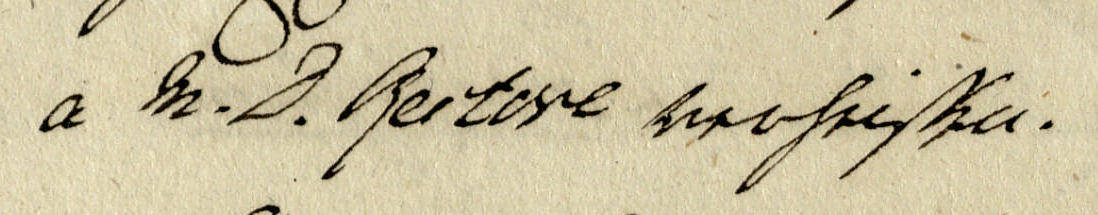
a M. D. Rectore verheissen.
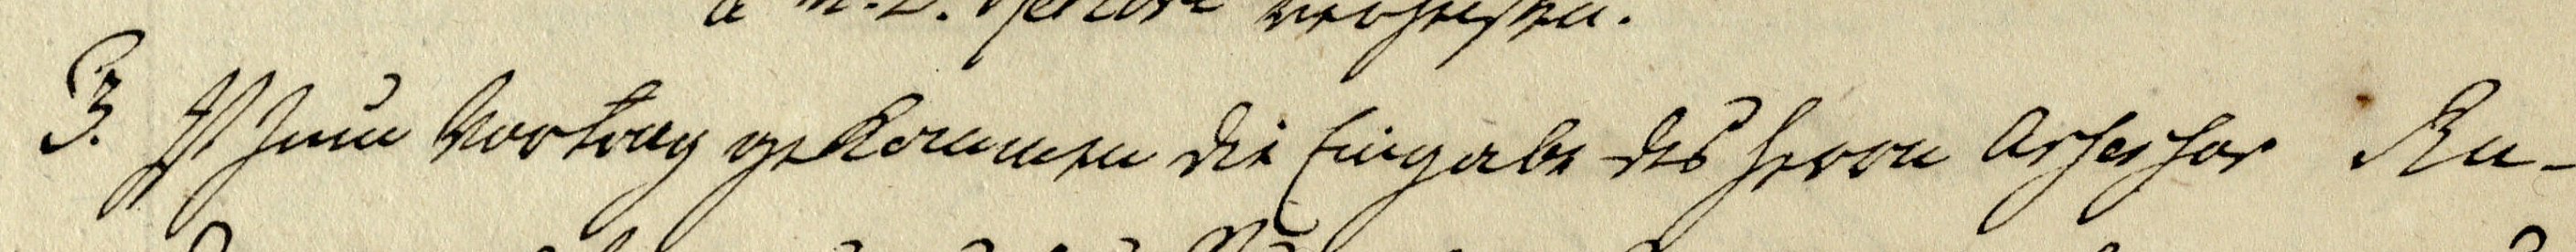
3. Ist zum Vortrag gekommen die Eingabe des Herrn Assessor Ru¬
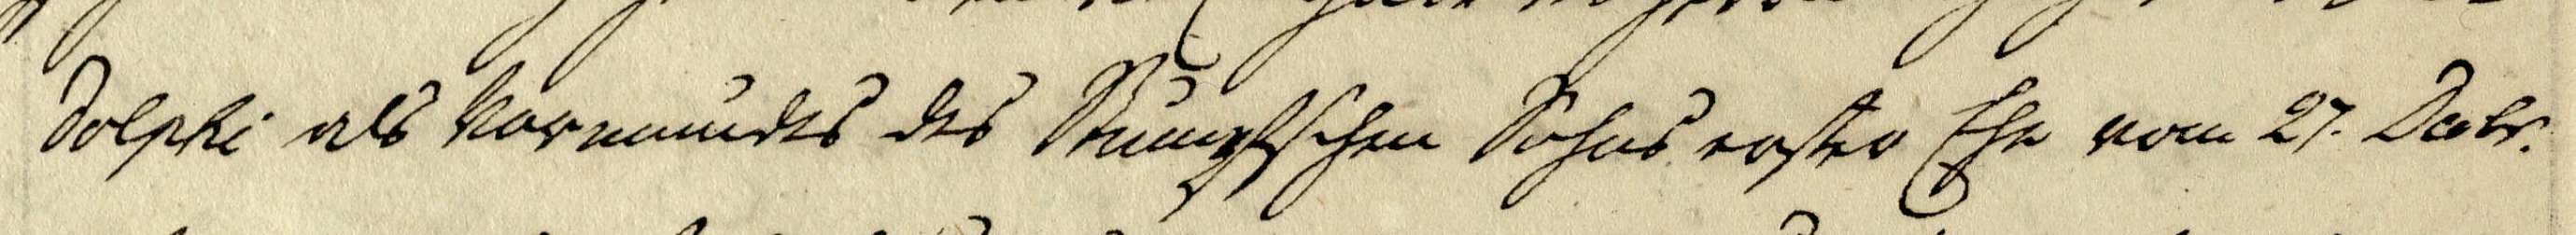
dolphi als Vormundes des Stumpfschen Sohns erster Ehe vom 27. Decbr.
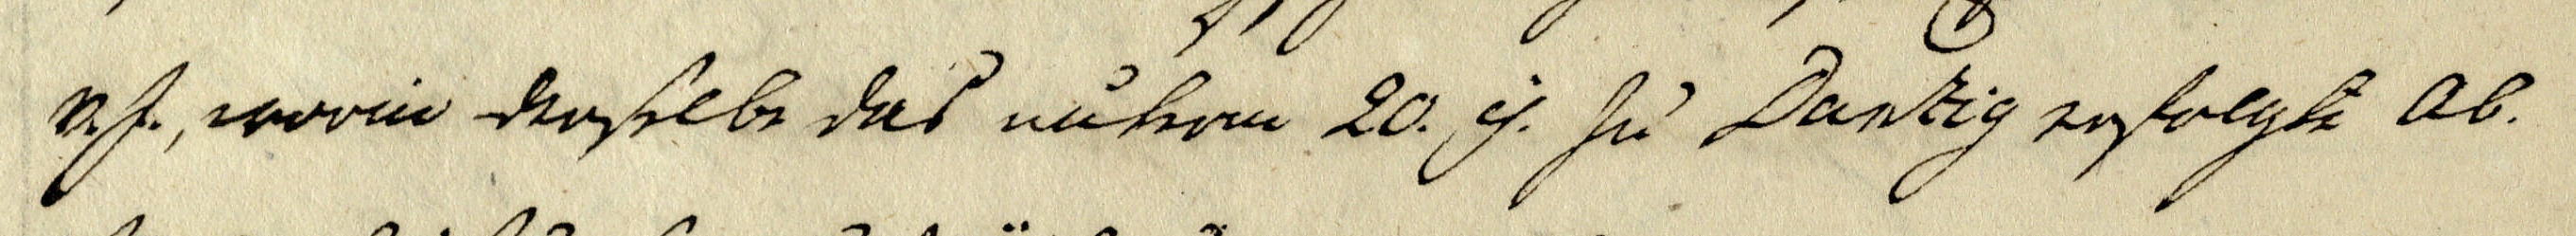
v. J., worin derselbe das unterm 20. ej. zu Danzig erfolgte Ab¬
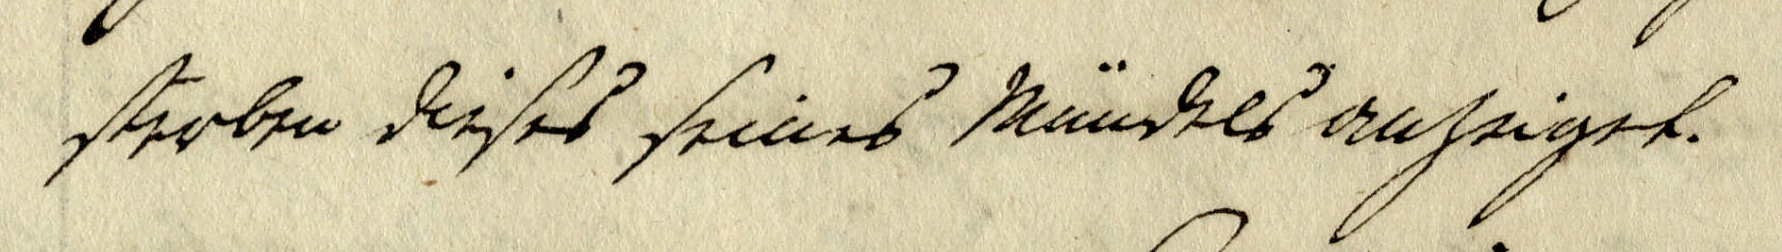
sterben dieses seines Mündels anzeiget.
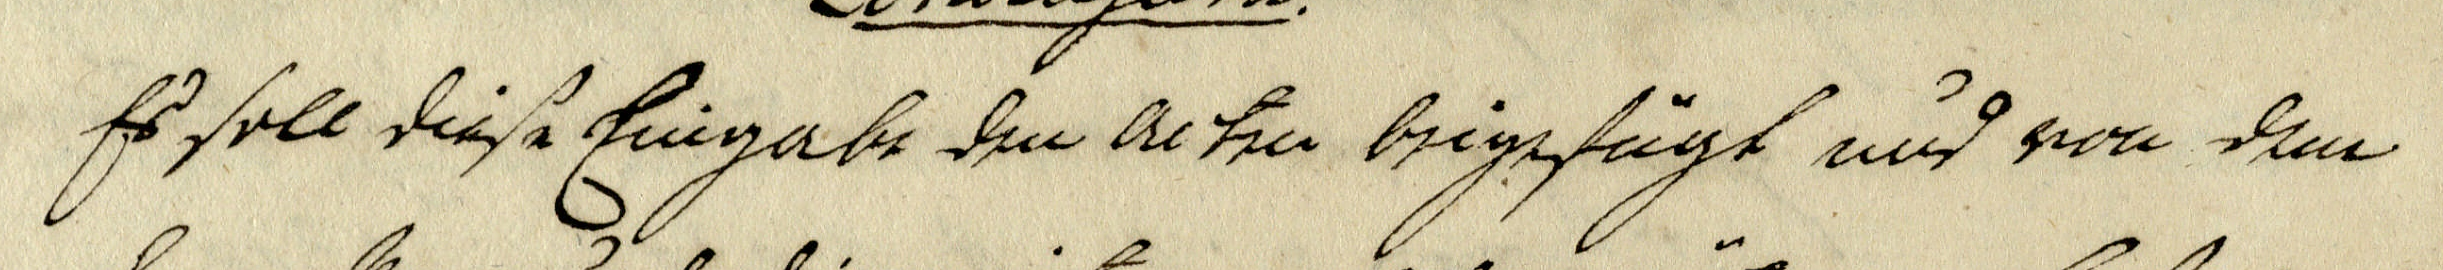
Es soll diese Eingabe den Acten beigefügt und von dem
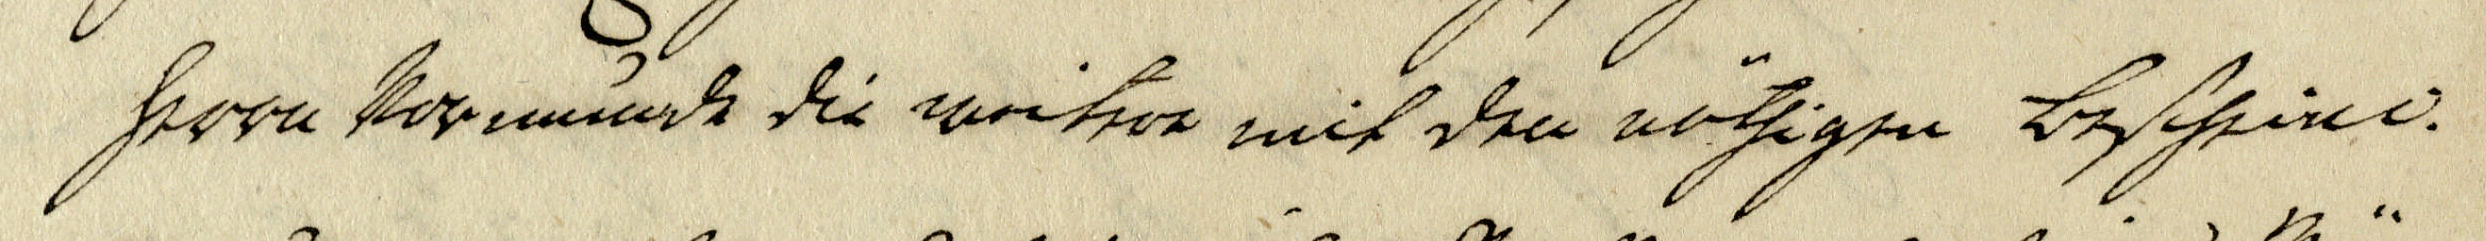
Herrn Vormunde die weitere mit den nöthigen Bescheini¬
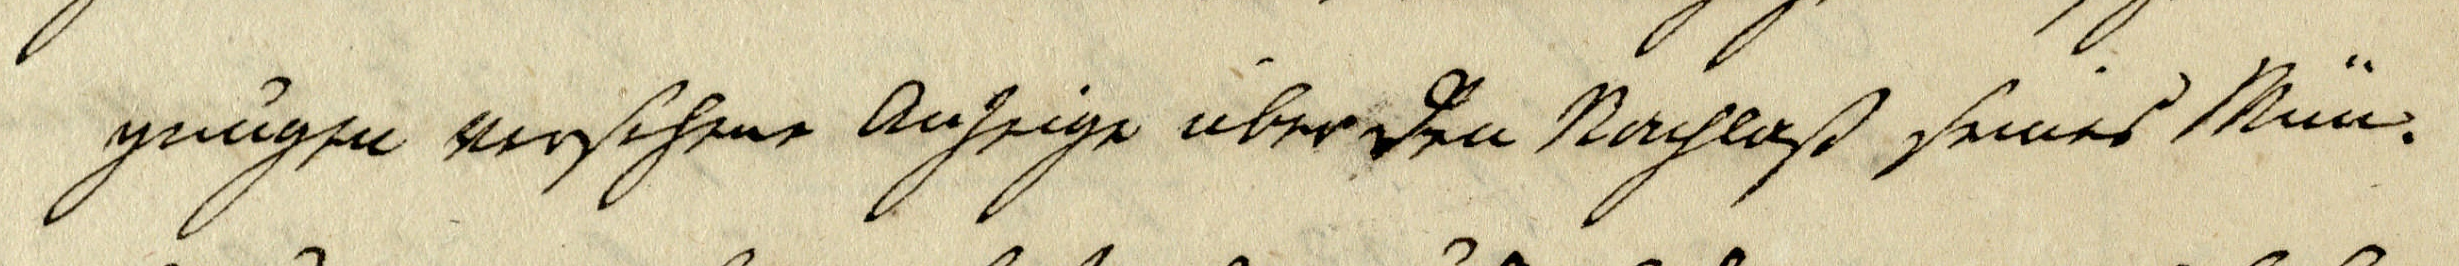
gungen versehene Anzeige über den Nachlaß seines Mün¬
